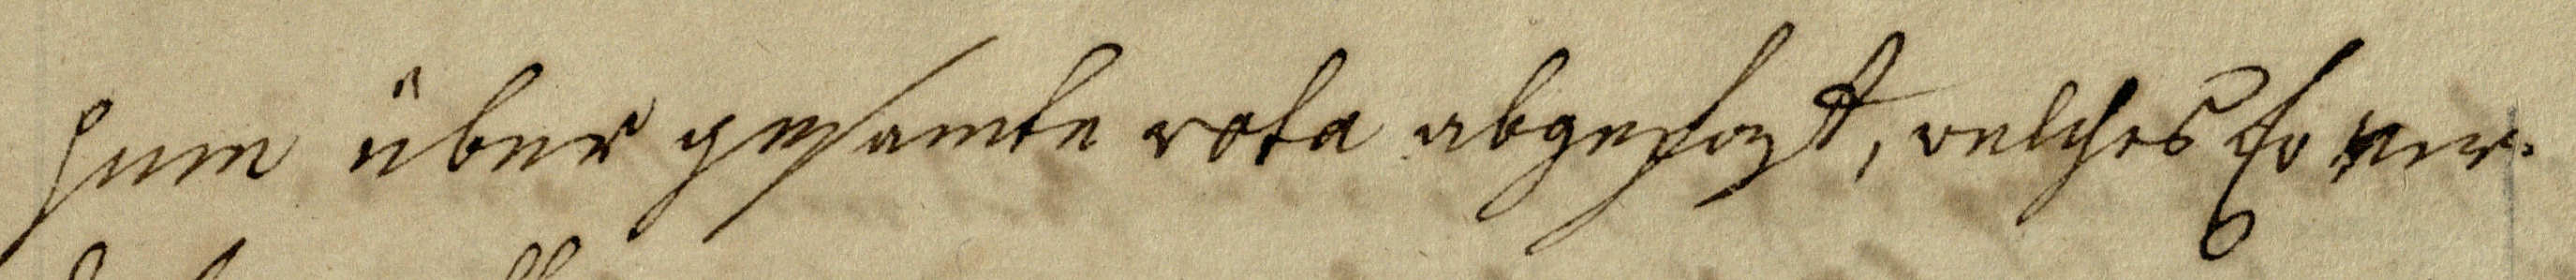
sum über gesamte vota abgefast, welches Er ver¬
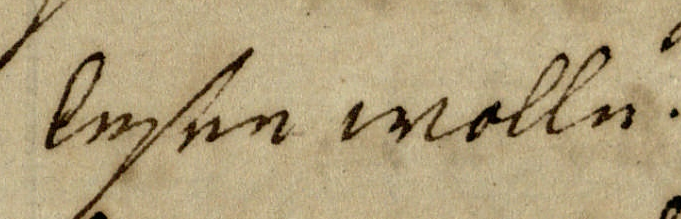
lesen wolle.
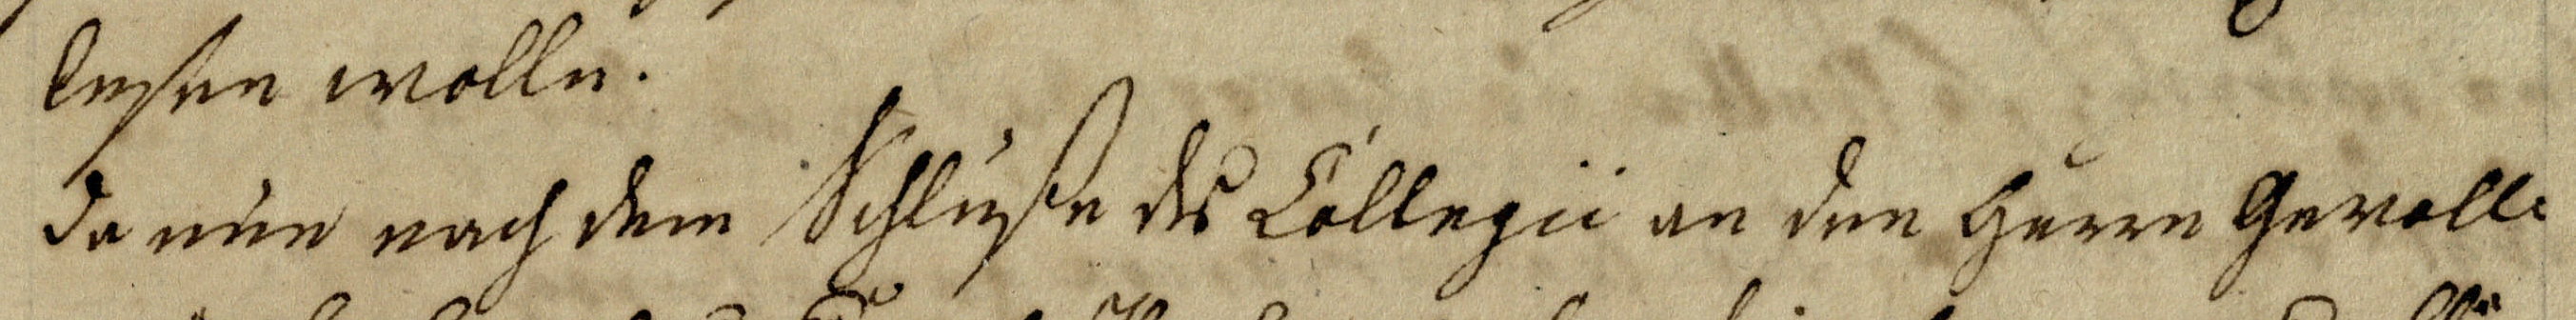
Da nun nach dem Schluße des Collegii an den Herrn Gevoll¬
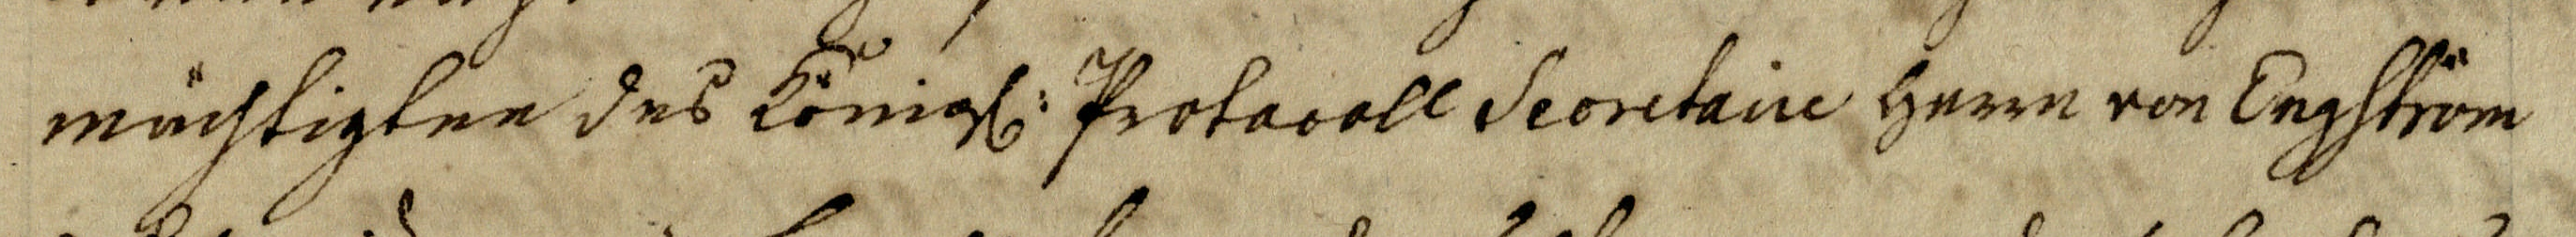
mächtigten des Königl. Protocoll Secretaire Herrn von Engström
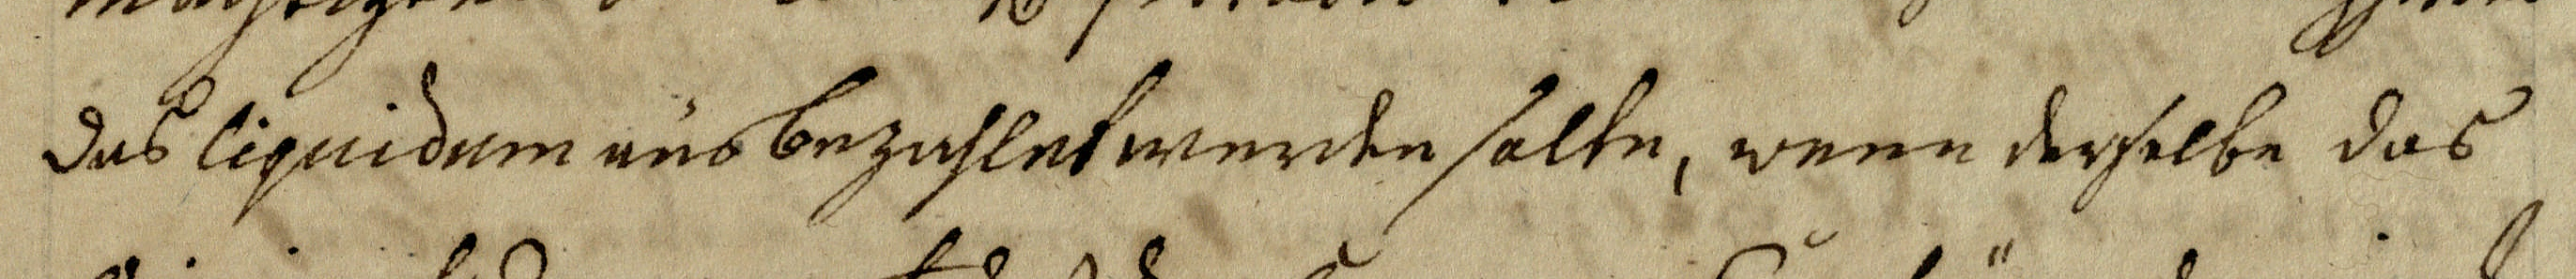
das liquidum ausbezahlet werden solte, wenn derselbe das
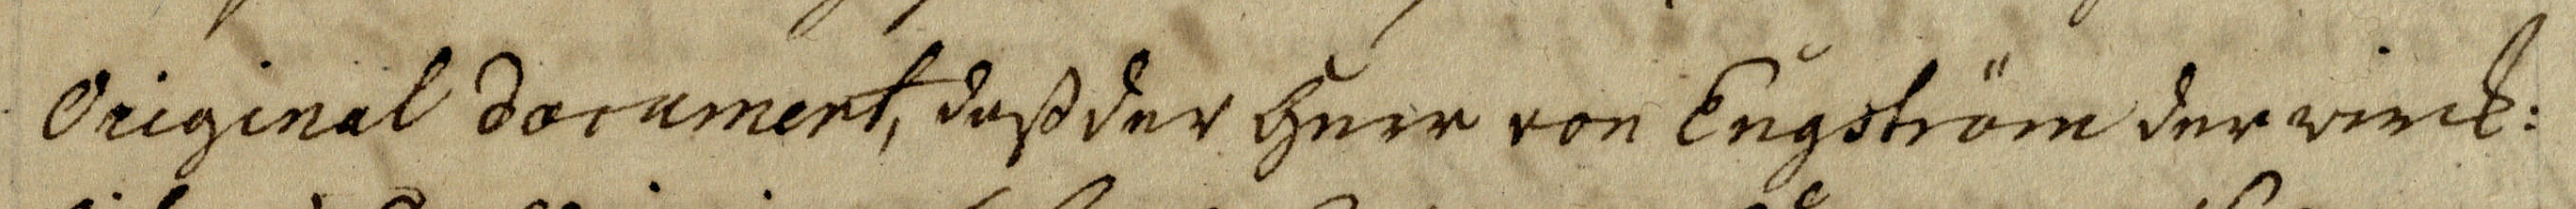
Original document, daß der Herr von Engström der wirk¬
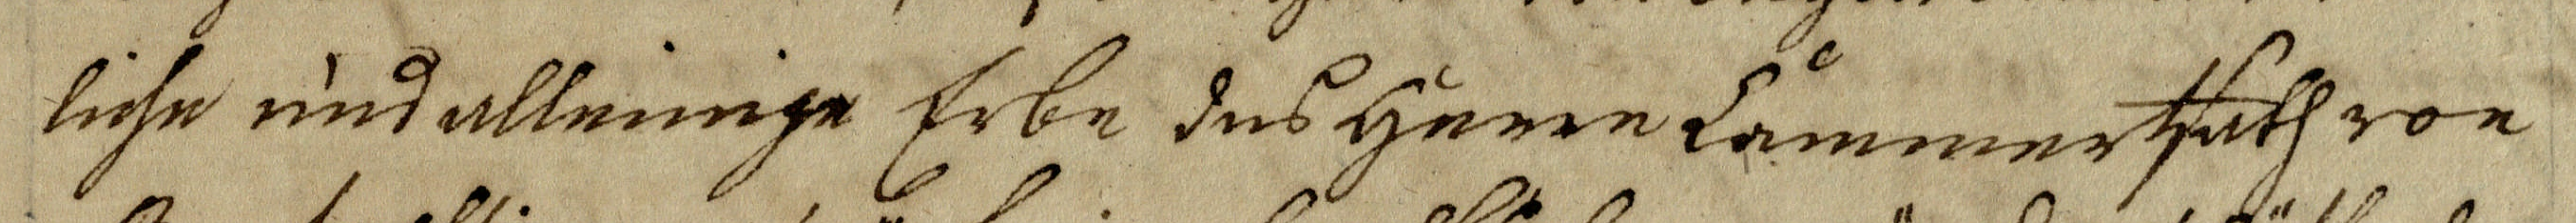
liche und alleinige Erbe des Herrn CammerRath von
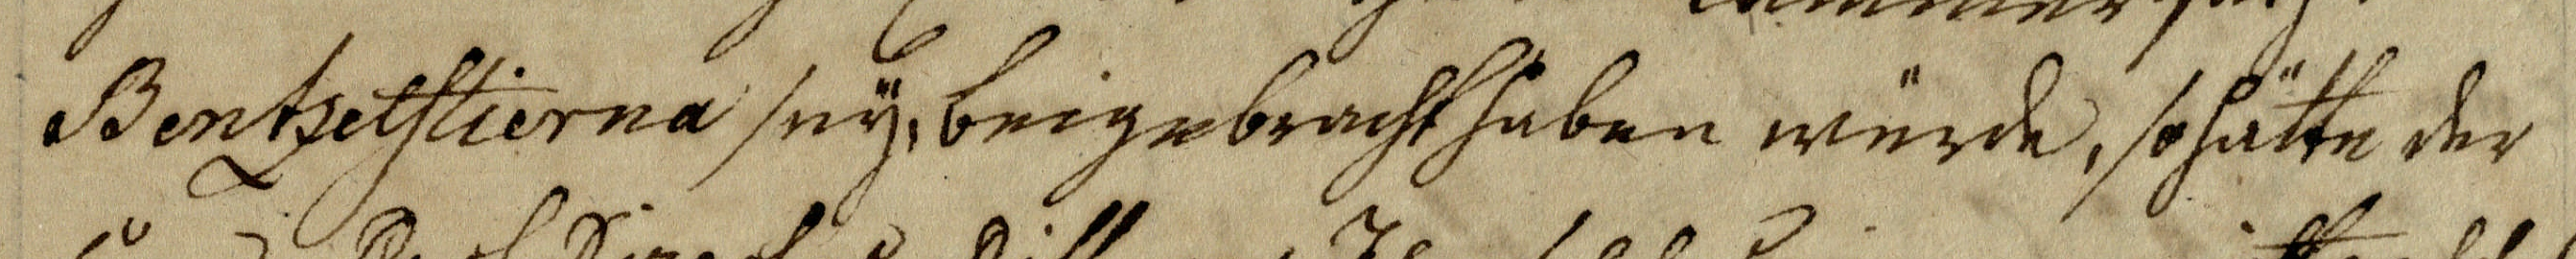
Bentzelstierna seÿ, beigebracht haben würde, so hätte der
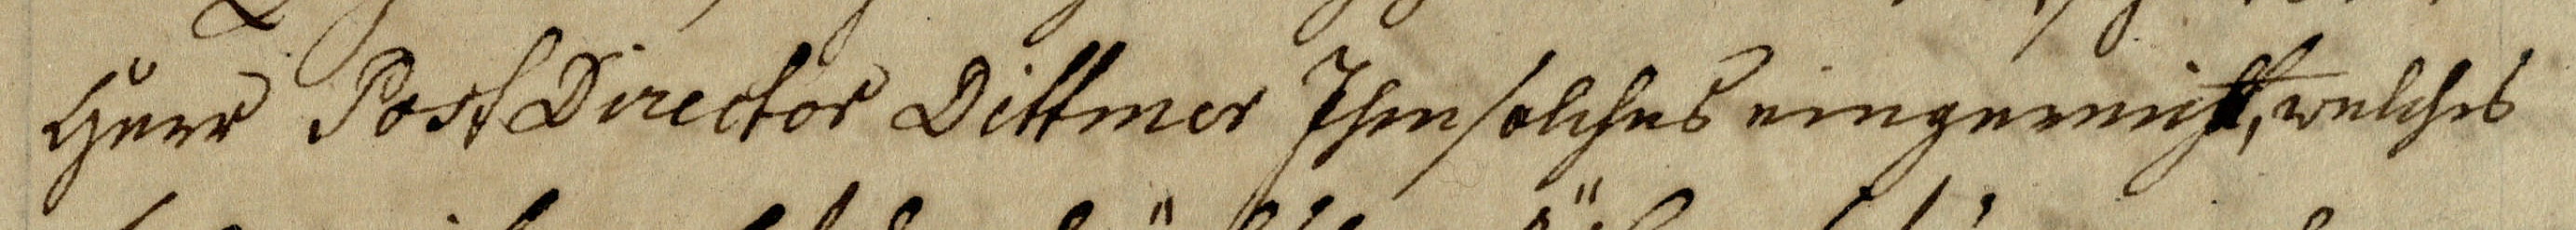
Herr PostDirector Dittmer Ihm solches eingereicht, welches
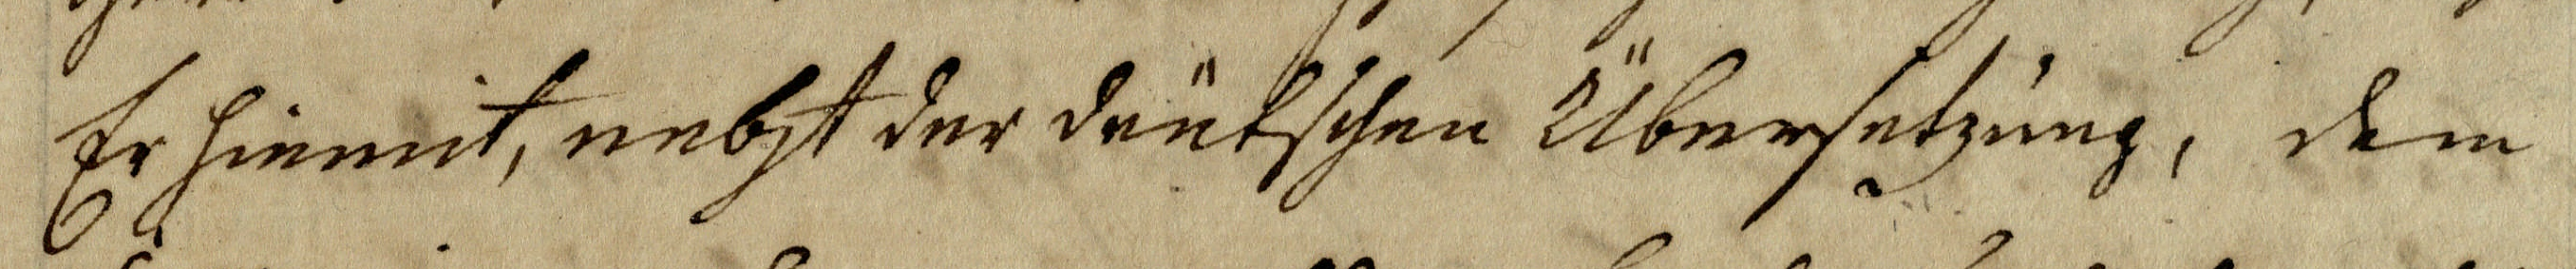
Er hiemit, nebst der deutschen Übersetzung, dem
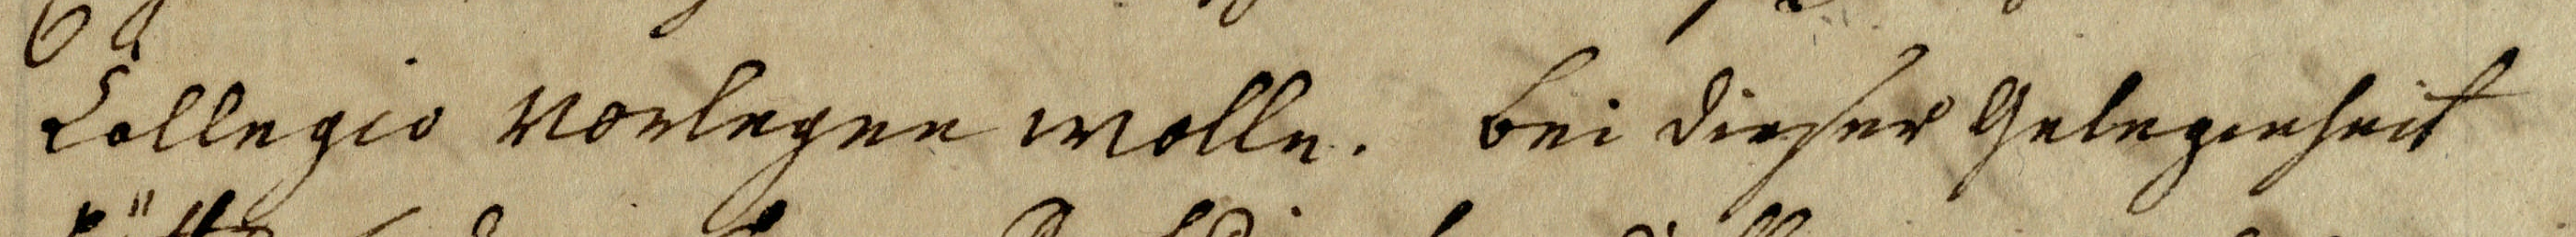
Collegio vorlegen wolle. Bei dieser Gelegenheit
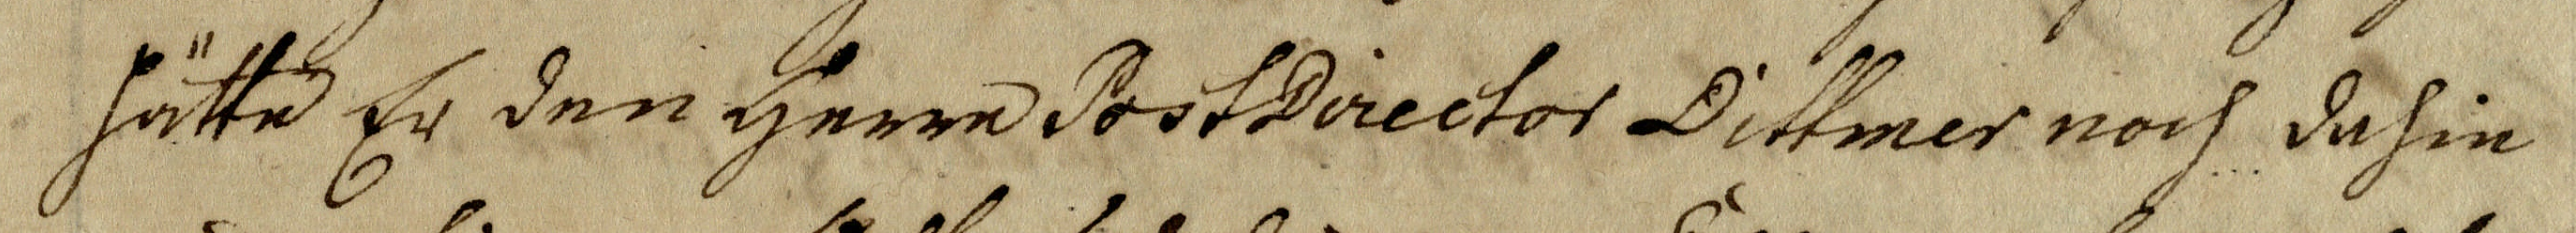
hätte Er den Herrn PostDirector Dittmer noch dahin
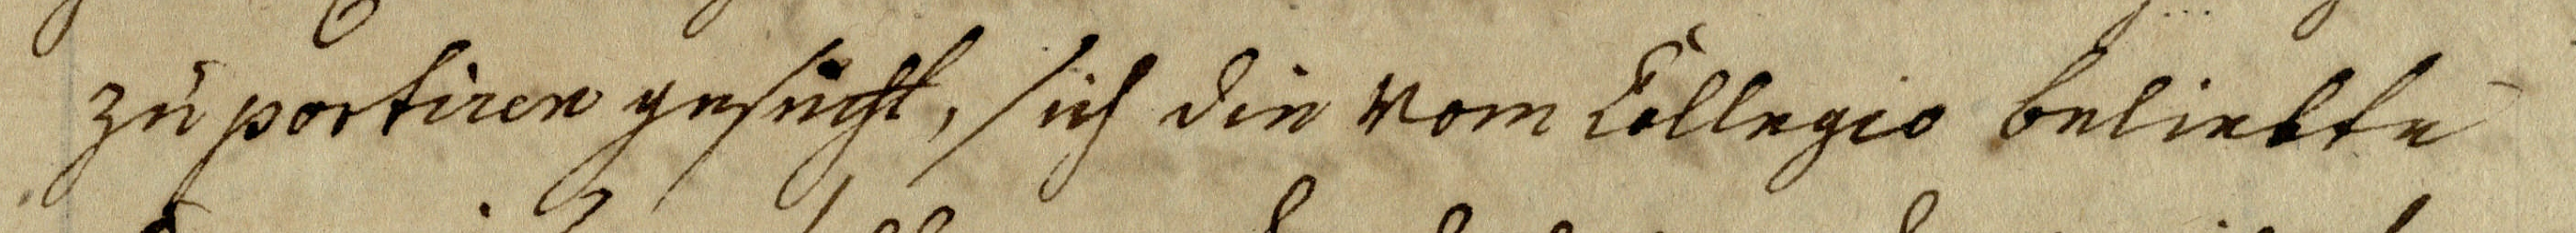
zu portiren gesucht, sich die vom Collegio beliebte
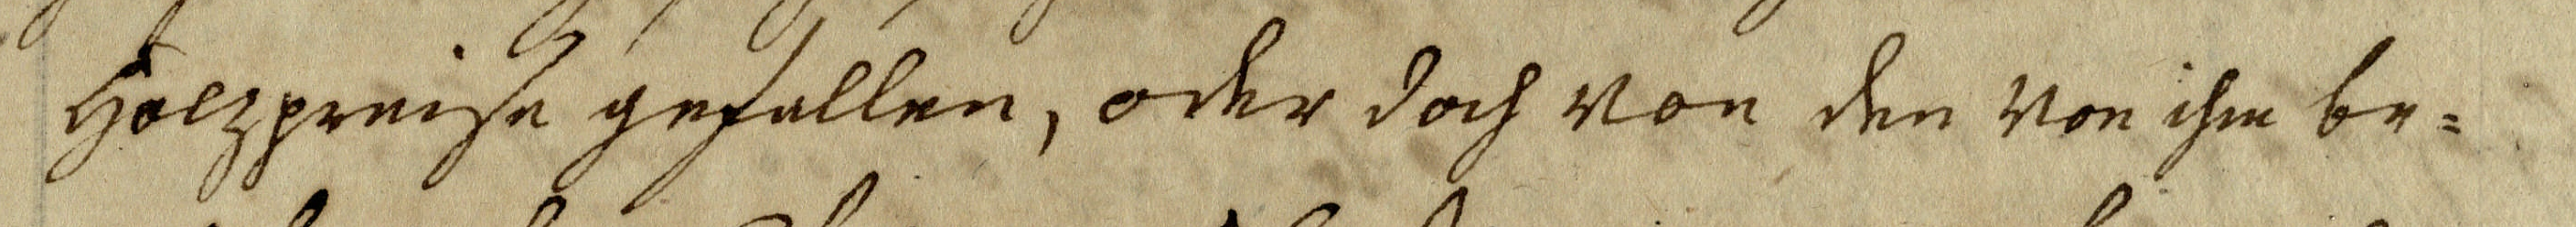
Holzpreise gefallen, oder doch von den von ihm be¬
